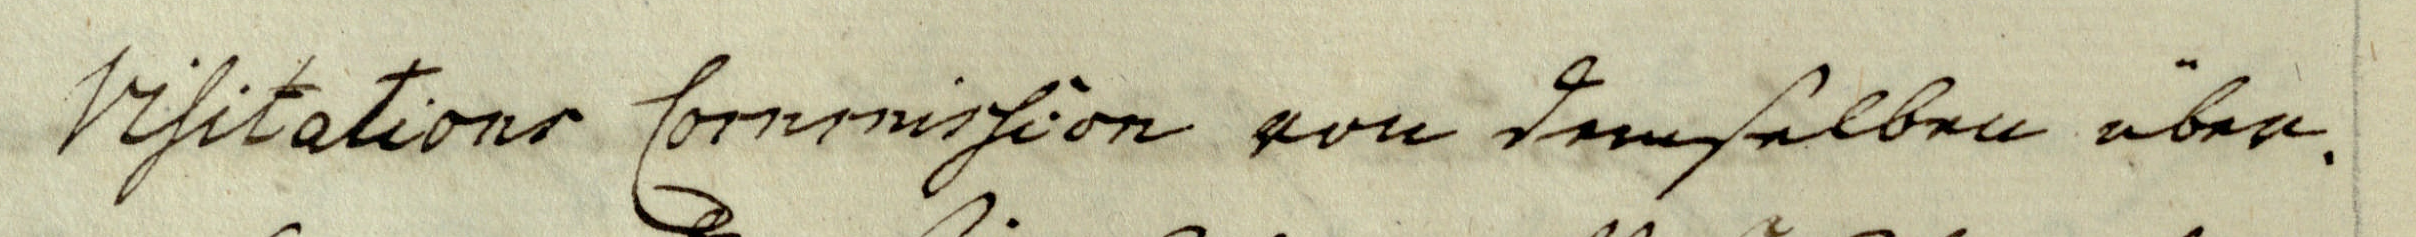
Visitations Commission von demselben über¬
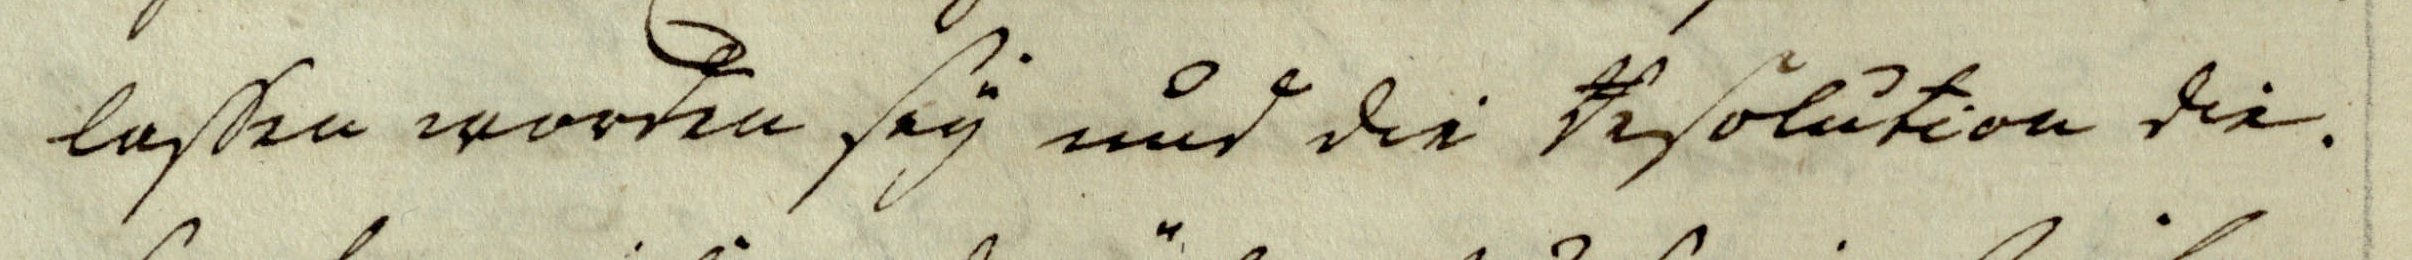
lassen worden seÿ und die Resolution die¬
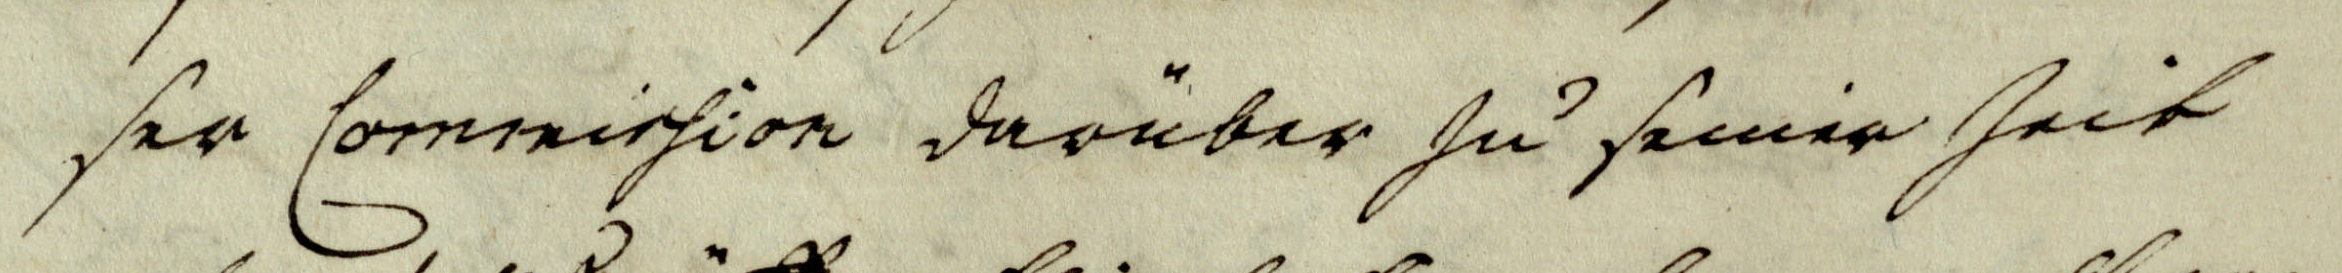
ser Commission darüber zu seiner Zeit
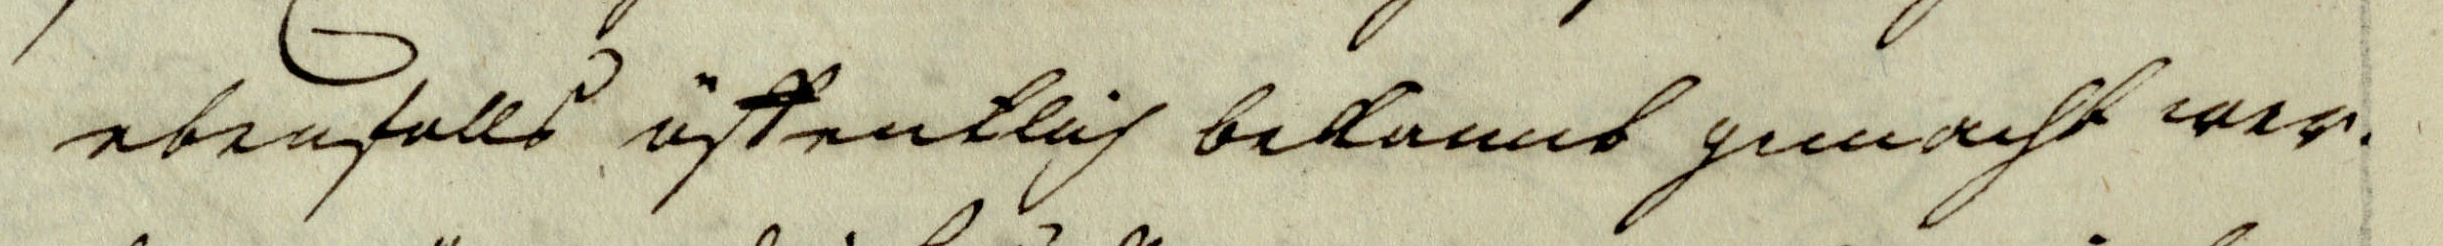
ebenfalls öffentlich bekannt gemacht wer¬
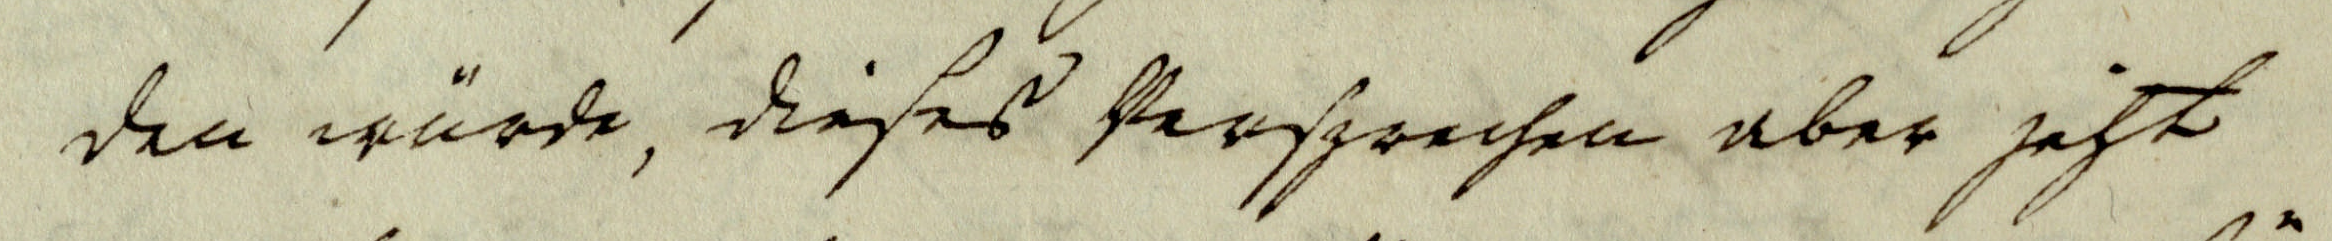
den würde, dieses Versprechen aber jetzt
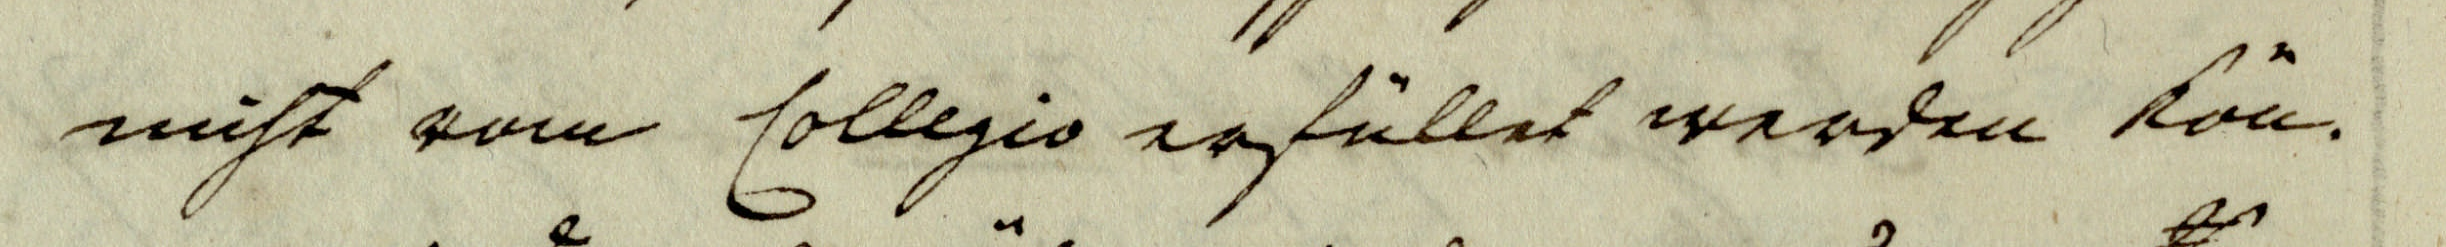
nicht vom Collegio erfüllet werden kön¬
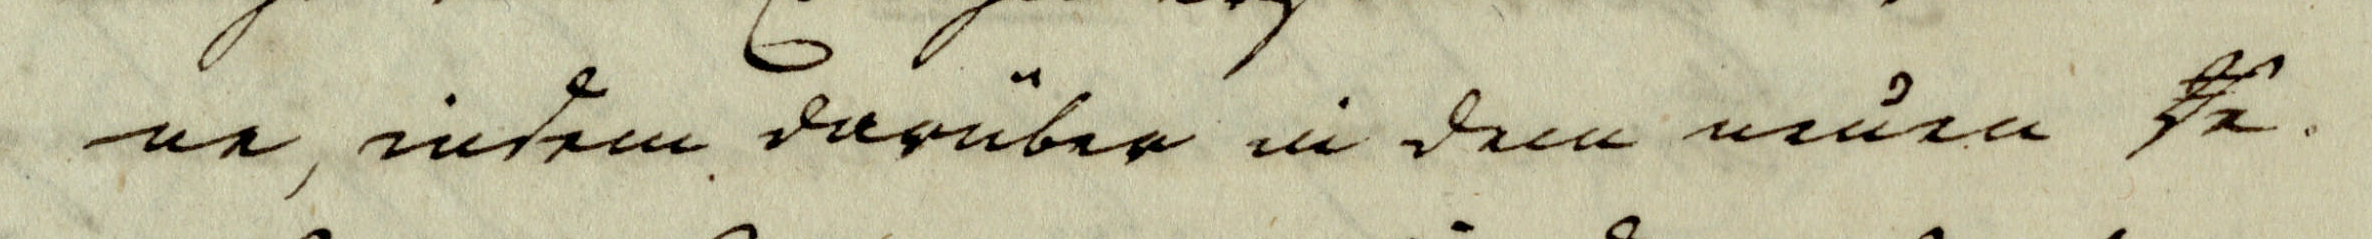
ne, indem darüber in dem neuen Re¬
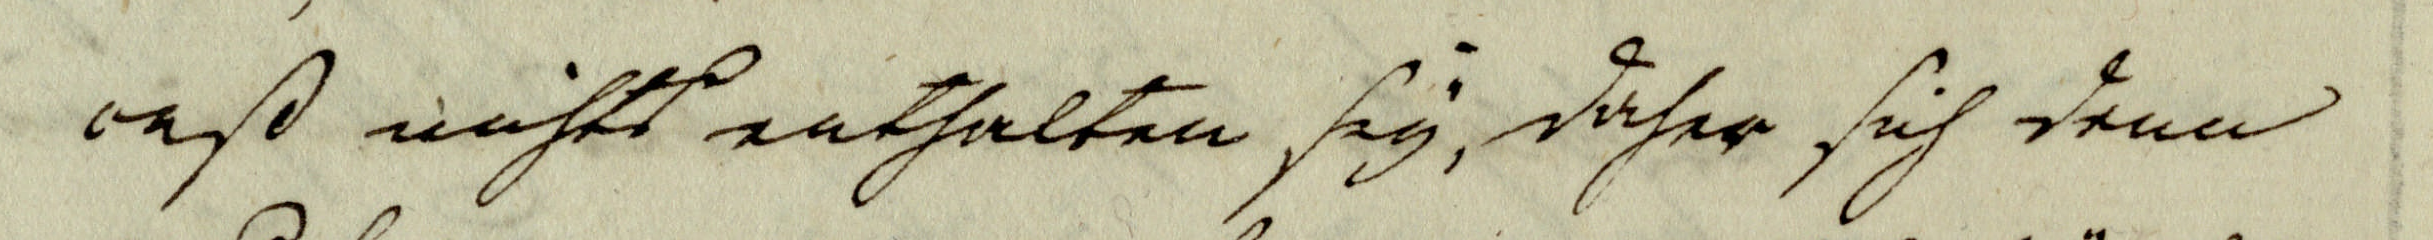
ceß nichts enthalten seÿ, daher sich denn
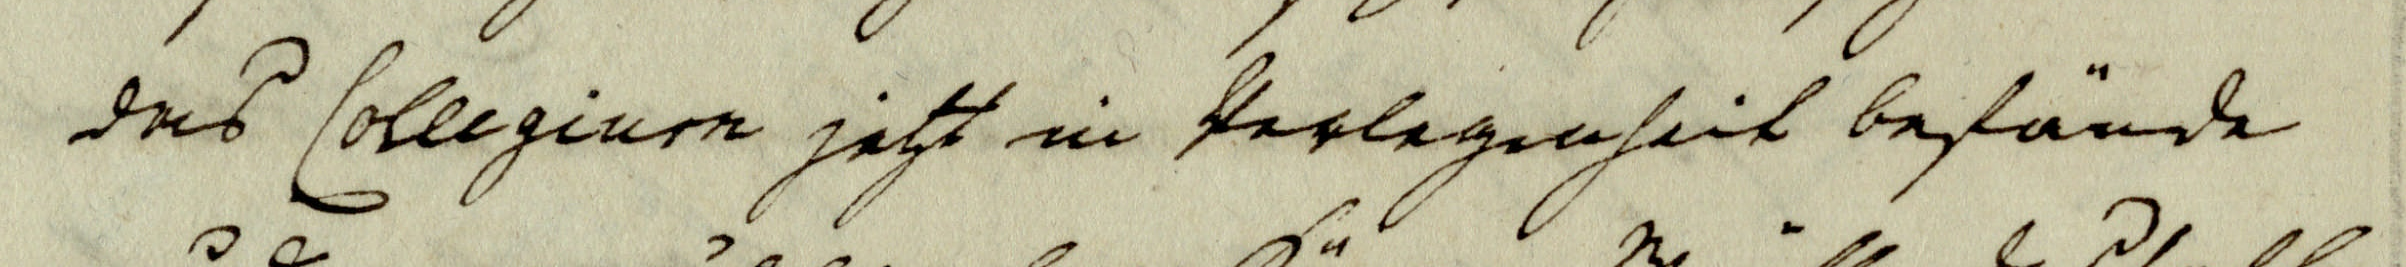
des Collegium jetzt in Verlegenhit befände
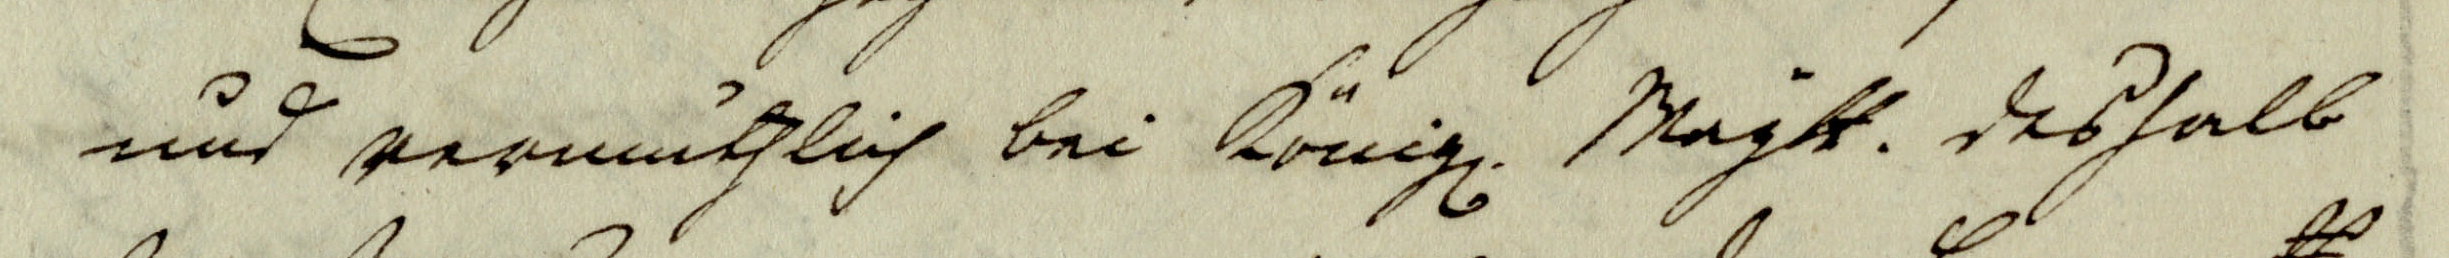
und verumthlich bei Königl. Maÿst. deshalb
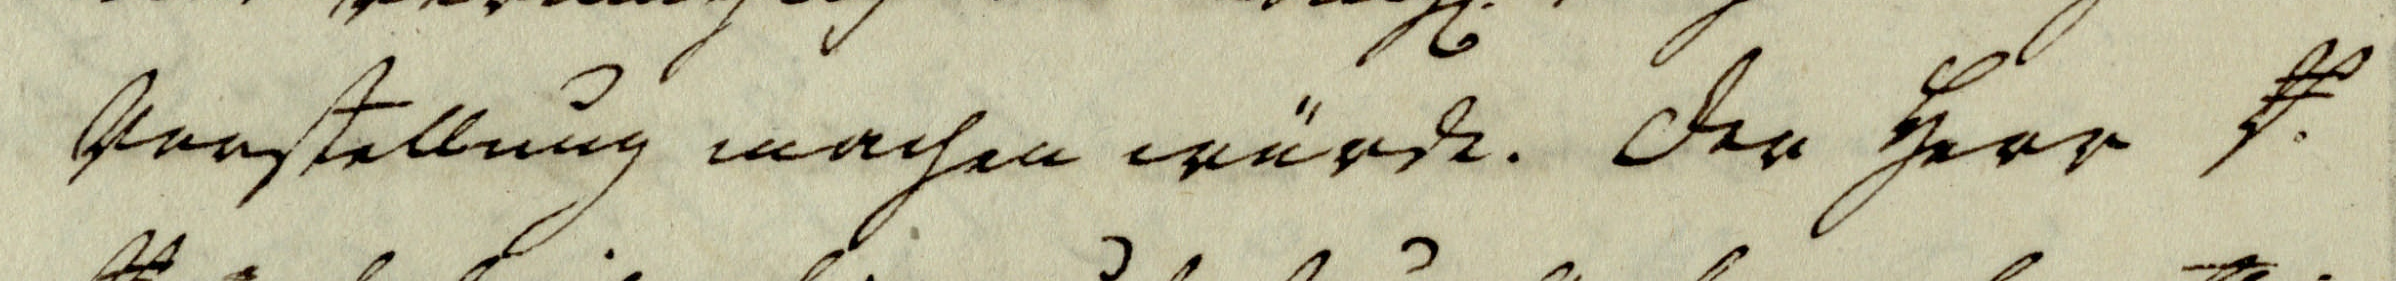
Vorstellung machen würde. Der Herr R.
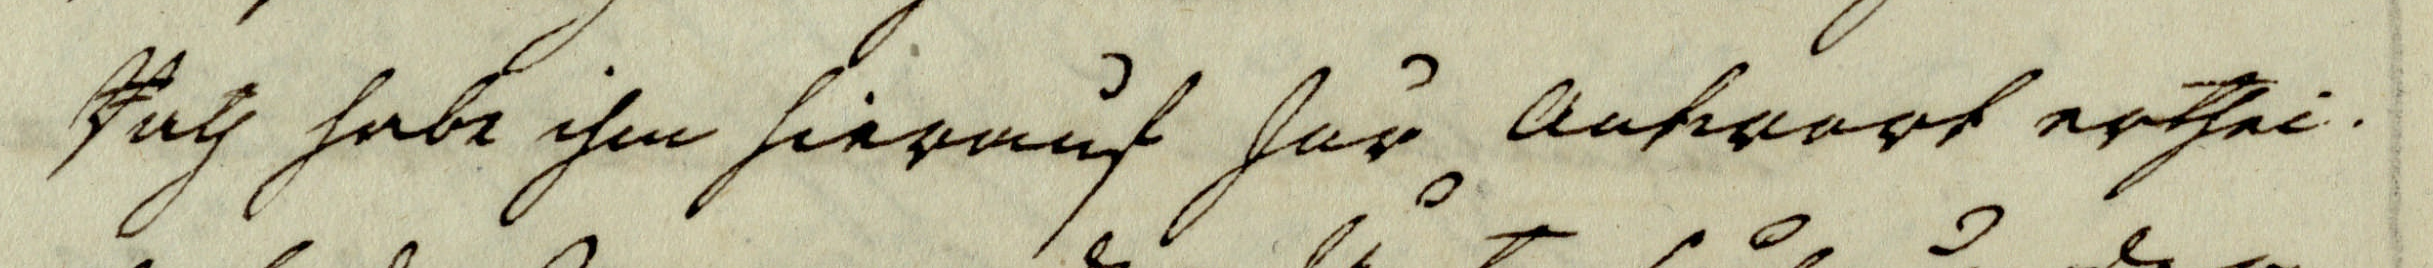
Rath habe ihm hierauf zur Antwort erthei¬
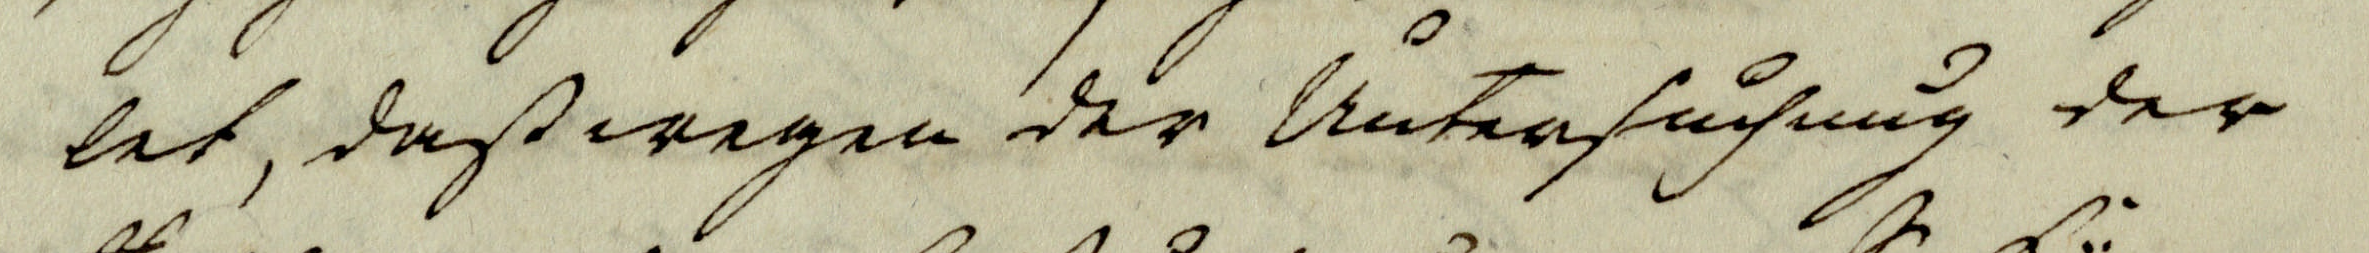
let, daß wegen der Untersuchung der
